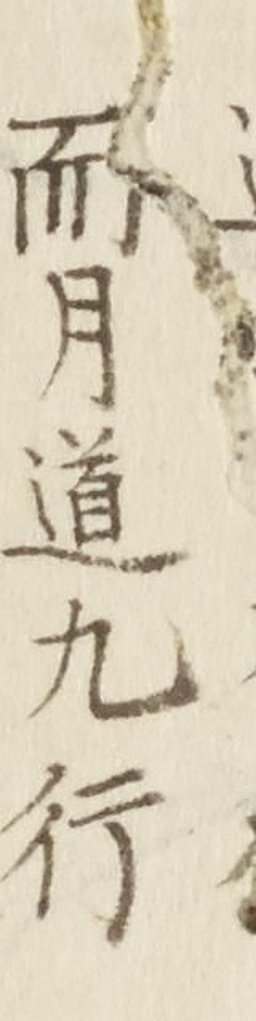而月道九行
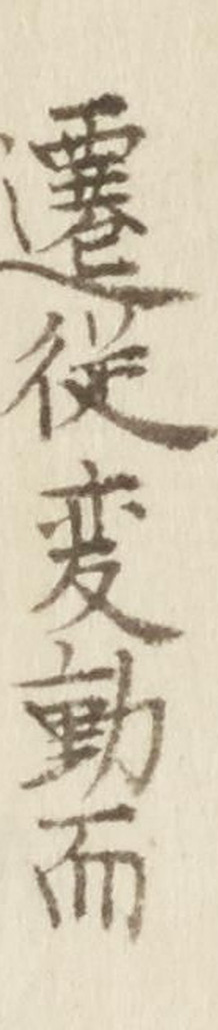遷従変動而
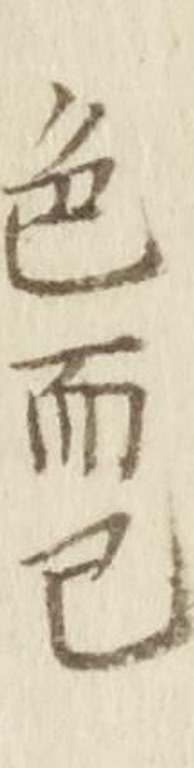色而已
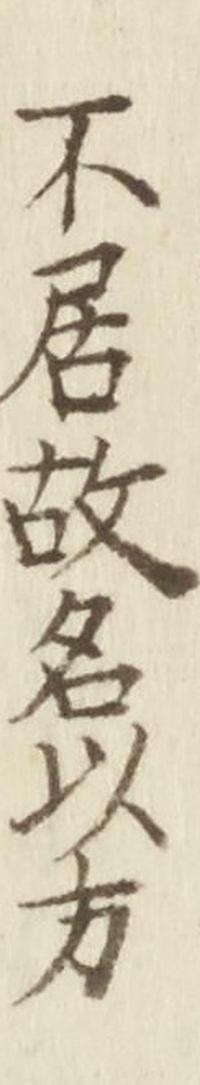不居故名以方

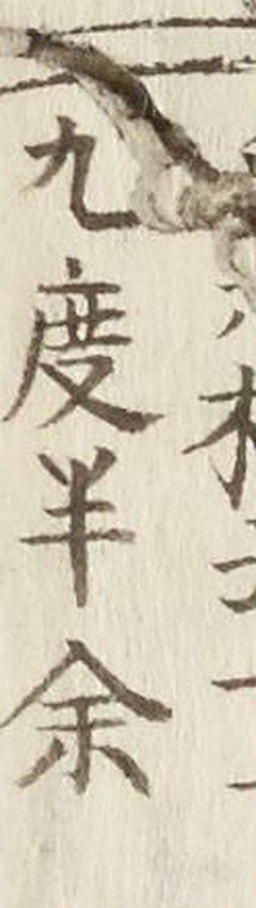九度半余
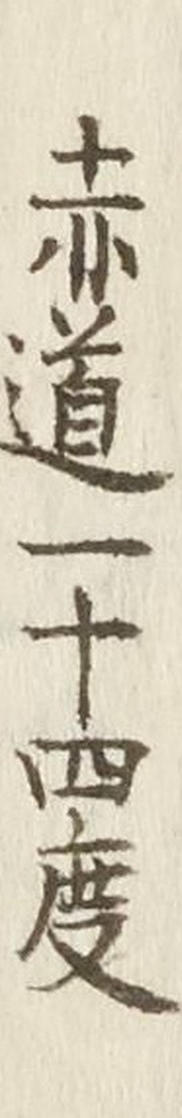赤道一十四度
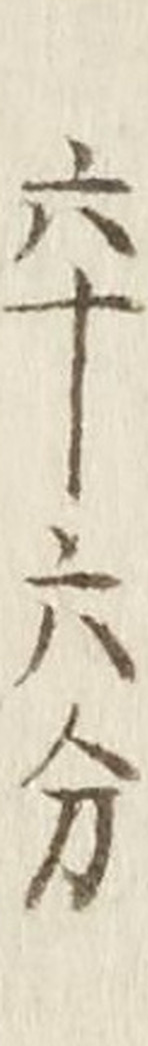六十六分
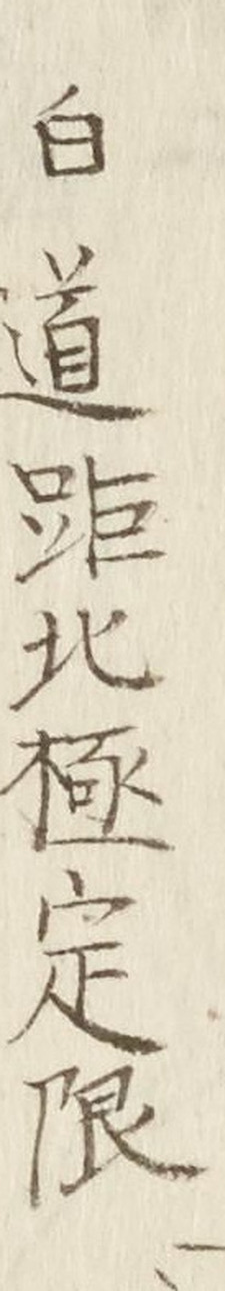白道距北極定限
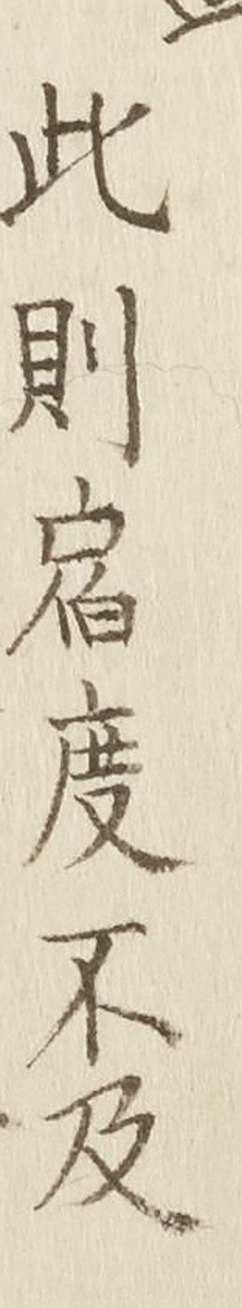此則宿度不及
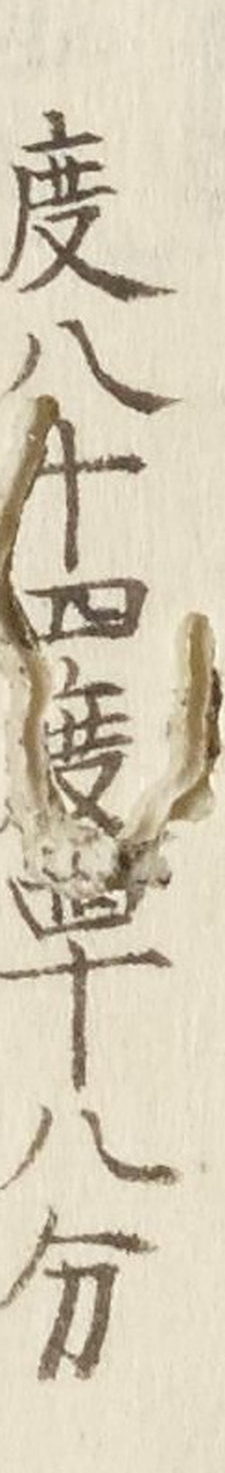度八十四度四十八分
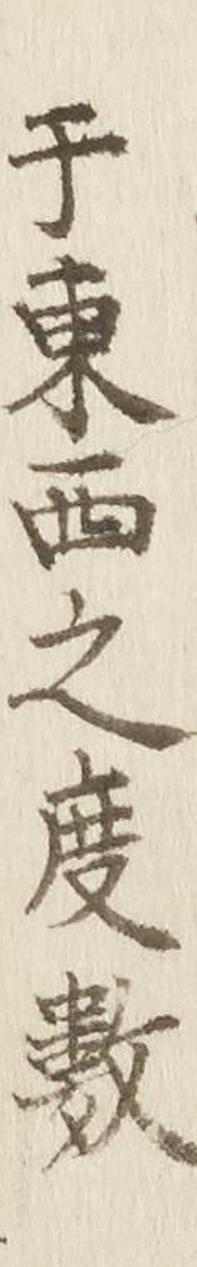于東西之度数
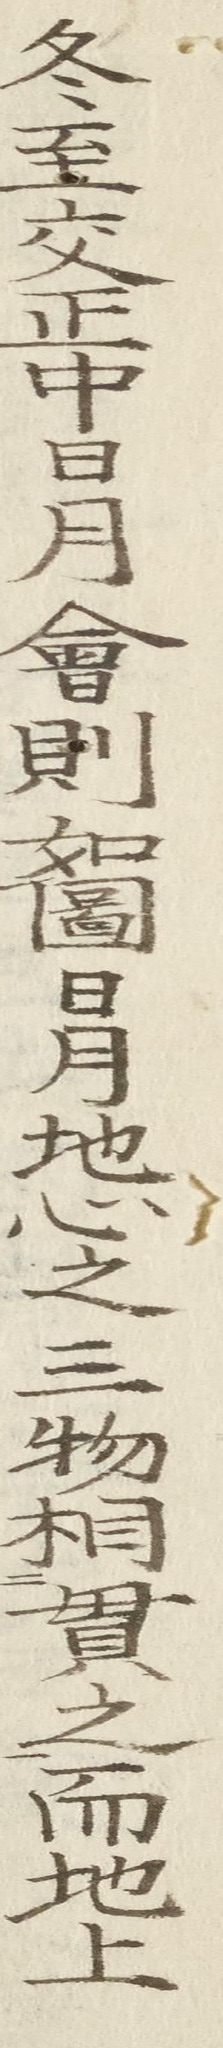冬至交正中日月会則如図日月地心之三者相貫之而地上
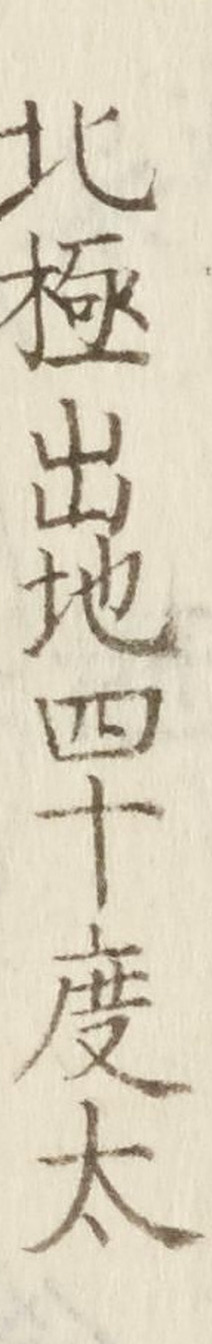北極出地四十度太
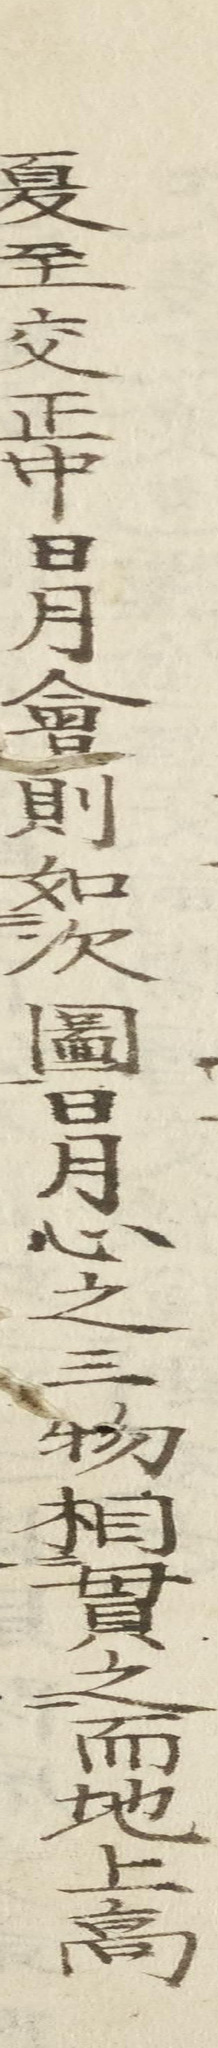夏至交正中日月会則如次図日月心之三物相貫之而地上高

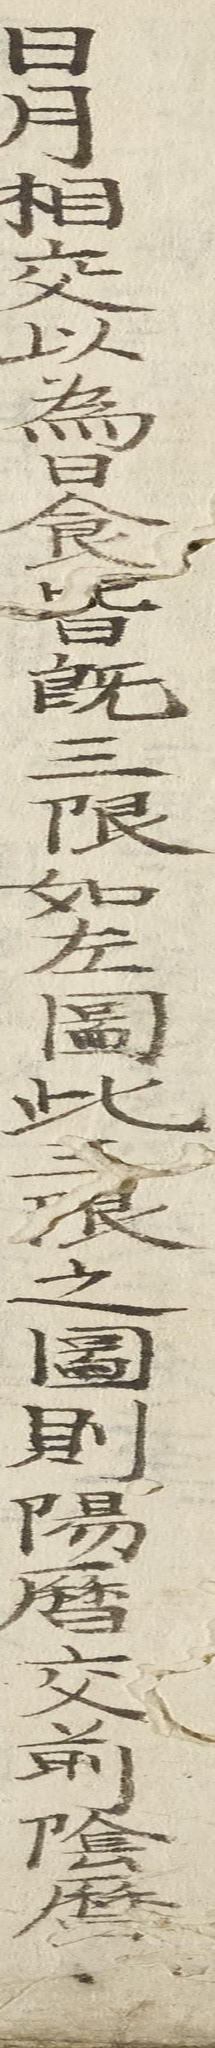日月相交以為日食皆既三限如左図此三限之図則陽暦交前陰暦
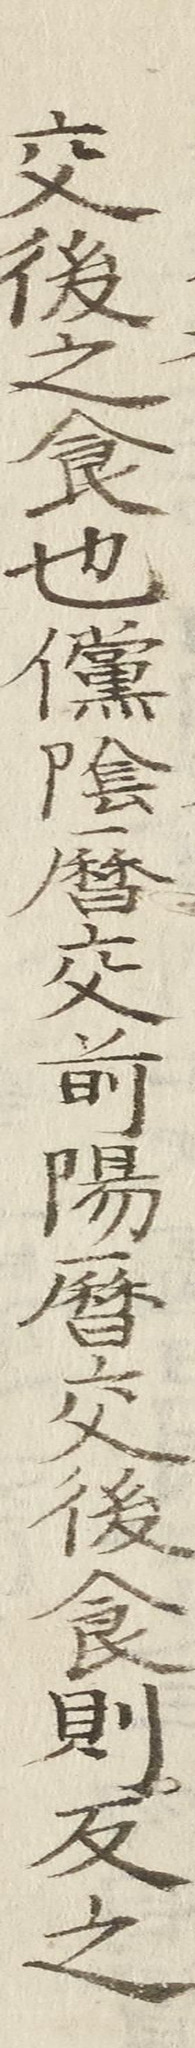交後之食也儻陰暦交前陽暦交後食則友也
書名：日食度
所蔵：東京大学地震研究所図書室 Earthquake Research Institute Library, The University of Tokyo, JAPAN
